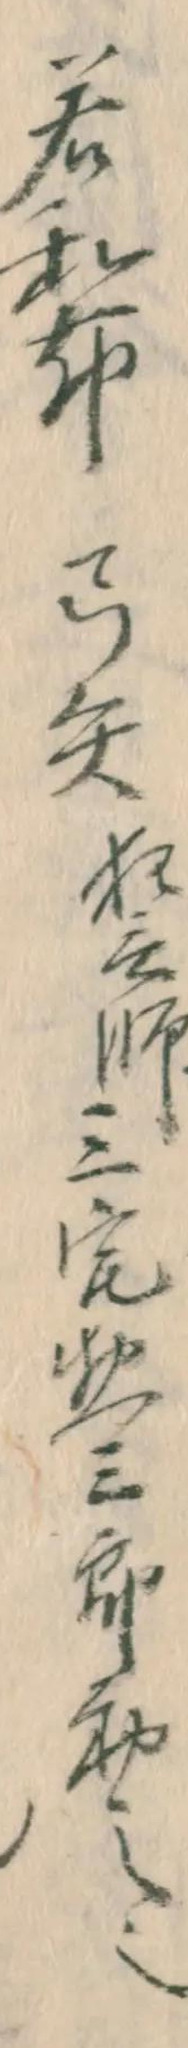若和布弓矢狂言師三宅惣三郎勤之也
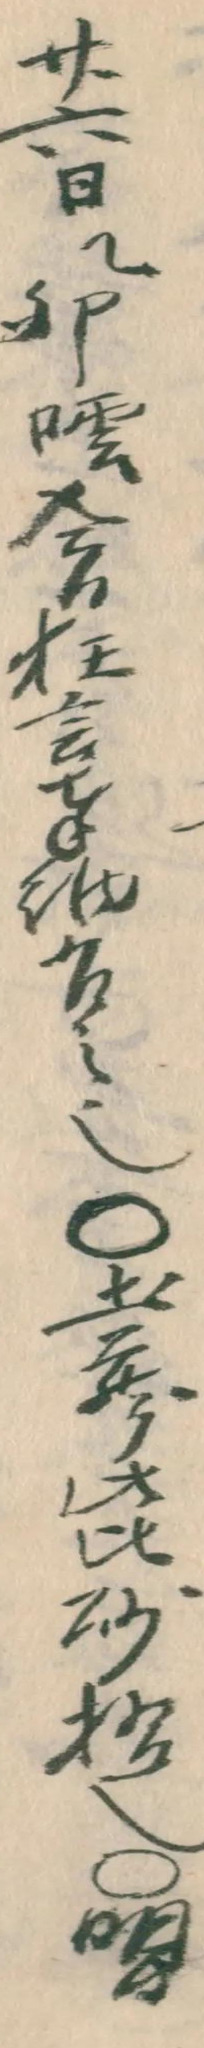廿六日乙卯雲合柱言奉納有之也〇土蔵此頃砂摺之○明日
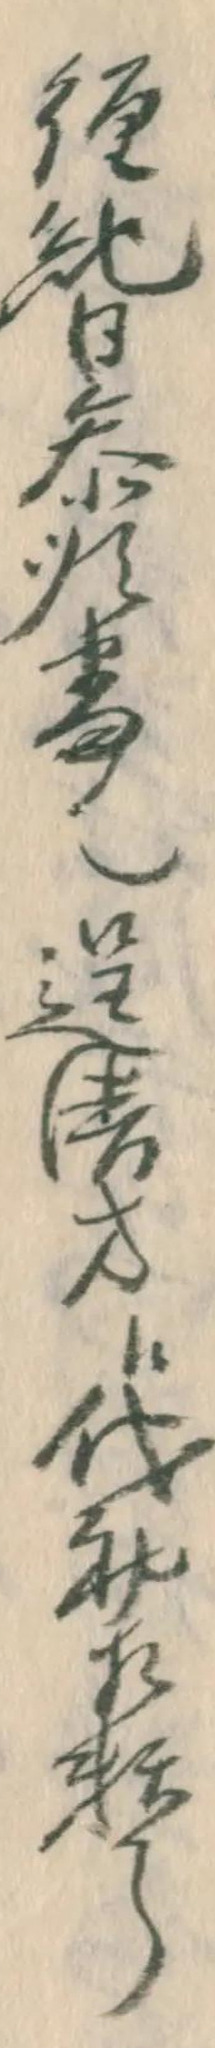経紀日参順番也逞清方え代勤相頼了
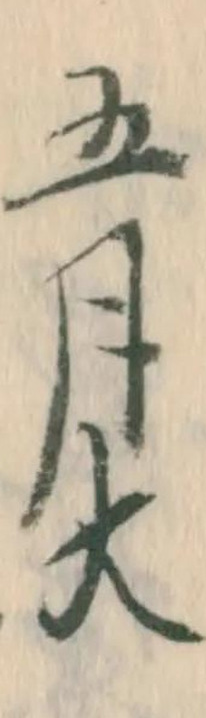五月大
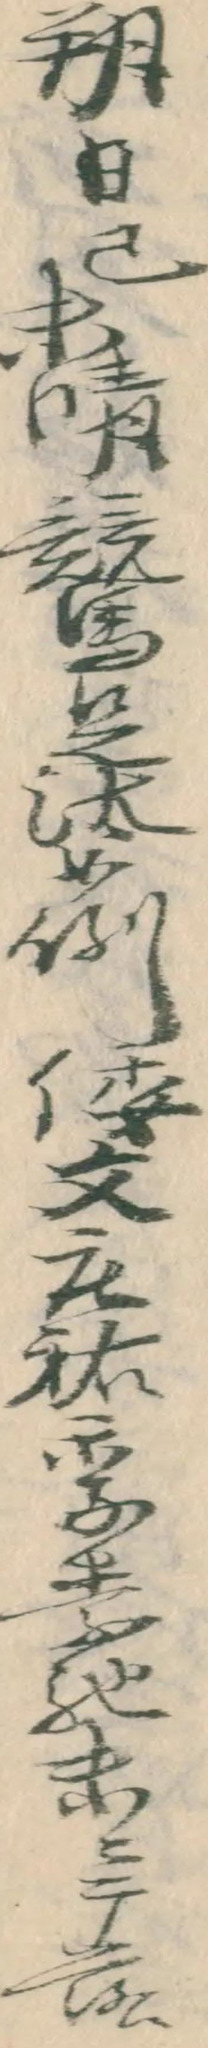朔日己未晴競馬足如例倭文庄祐季等馳未ニテ落
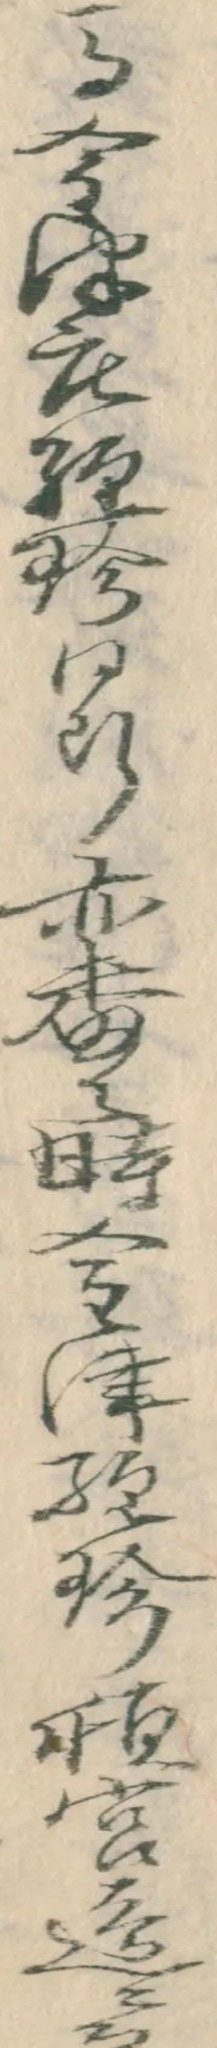馬金津庄経珍同断亦番之時金津経珍頓宮邊ニ而
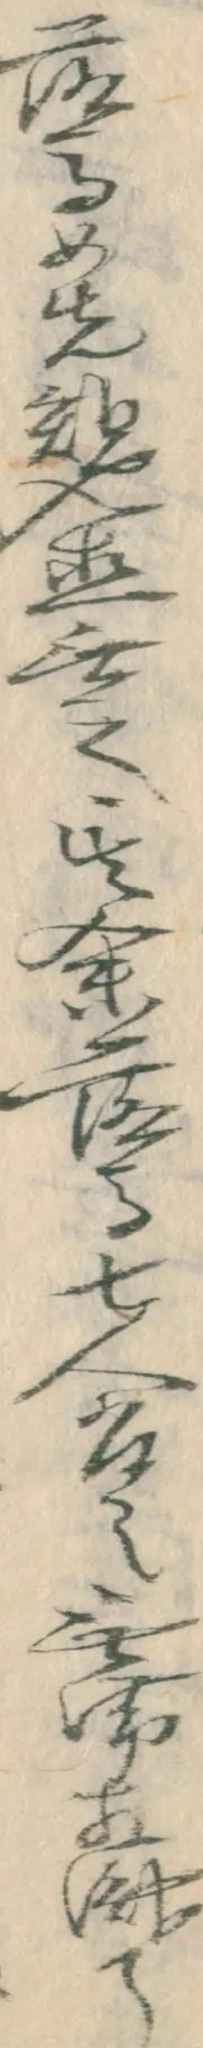落馬如先規入直無之其余落馬七人有之無滞相済了
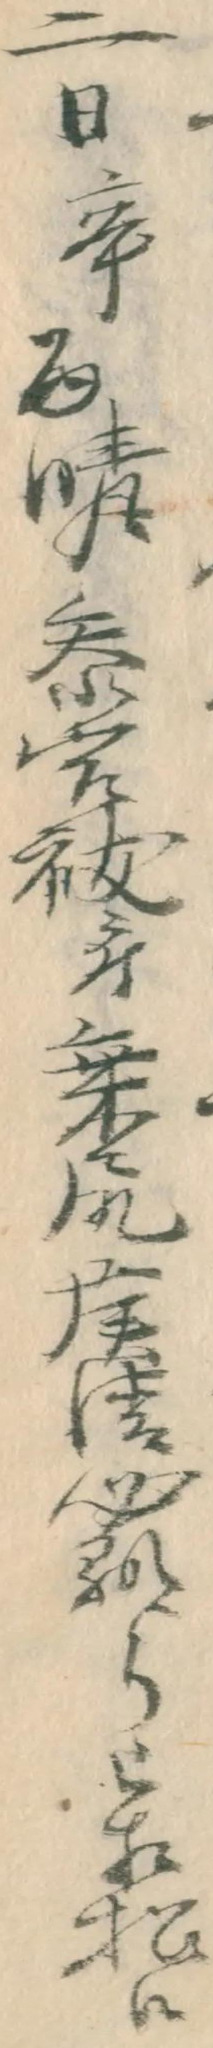三日辛酉晴参宮祓ニ付乗尻庚崖必顕より被相招候

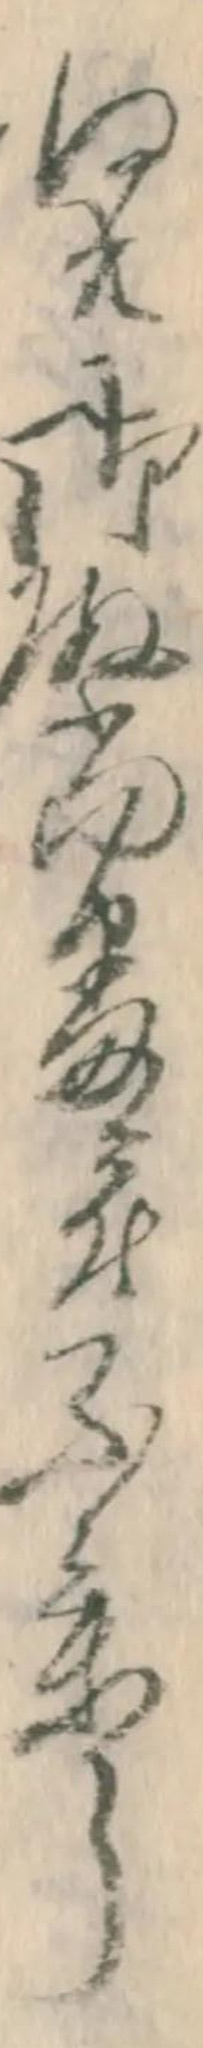得共御殿當番ニ付不参了
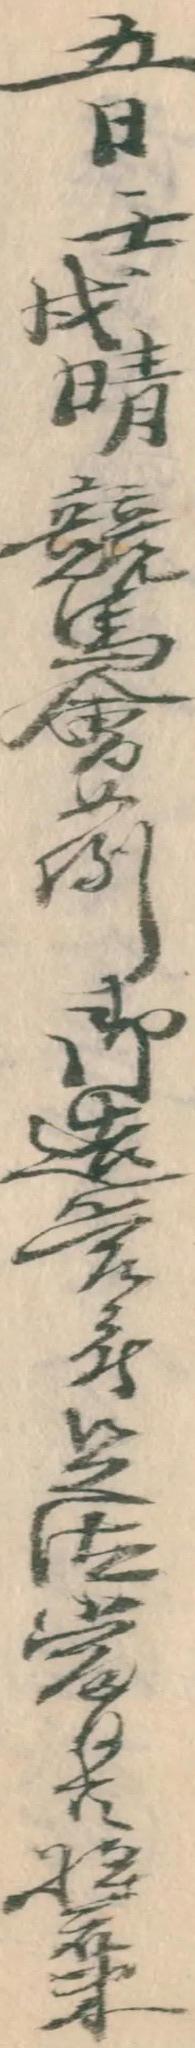五日壬戌晴競馬會如例御造営ニ付足汰當日共装束
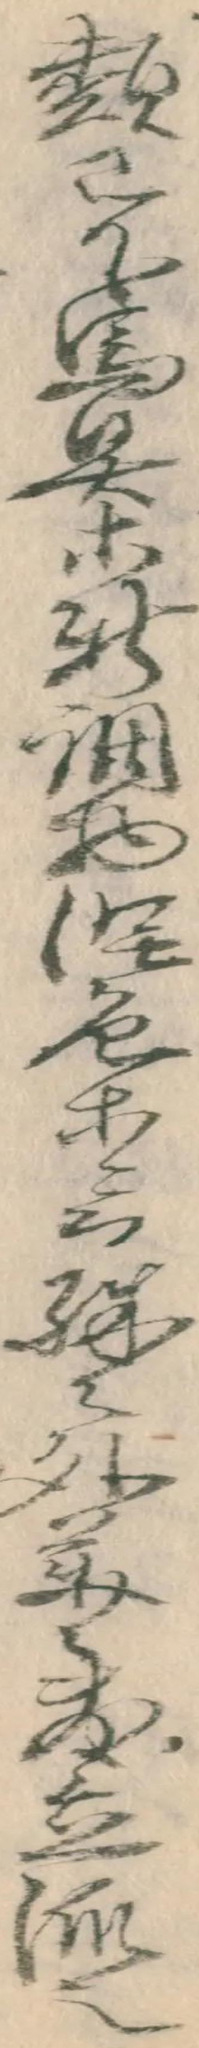類已下馬具等新調物深色等ニ而殊之外美々敷立派也
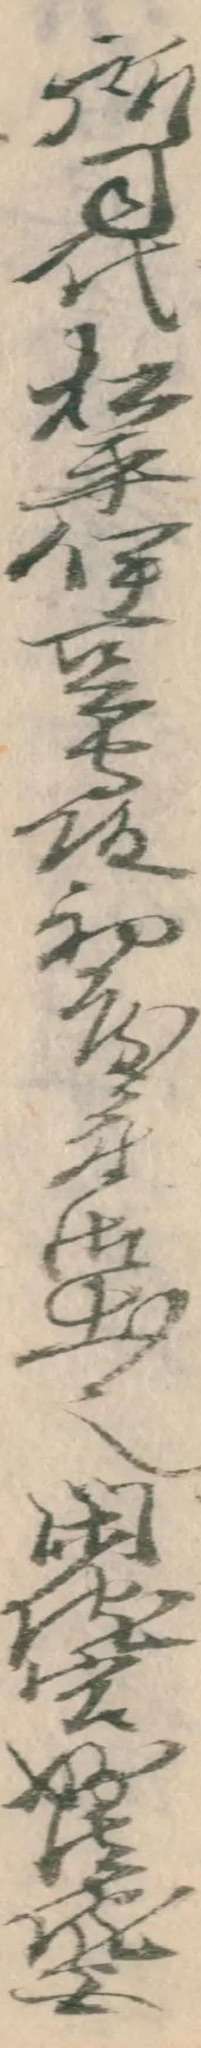所司代松平伊豆守殿初度ニ付御出也閑院宮妙法院宮
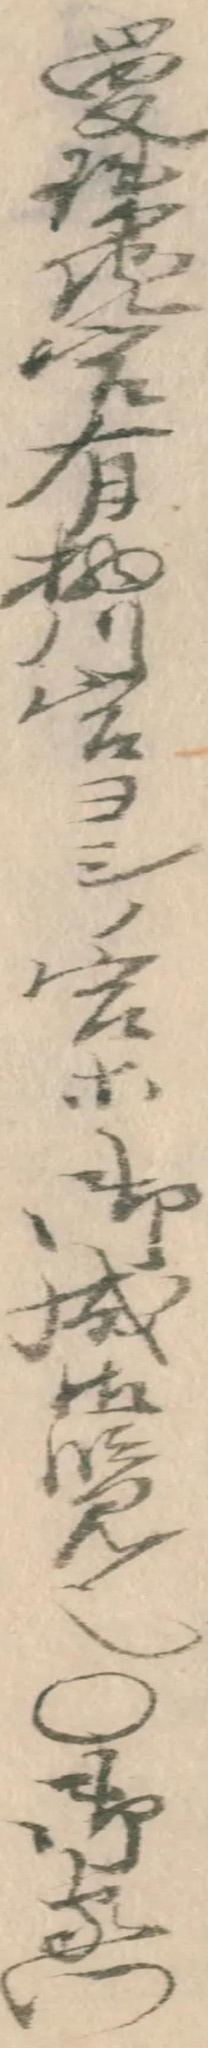曼殊院宮有栖川宮ヨシノ宮等へ御成御覧也○御家門
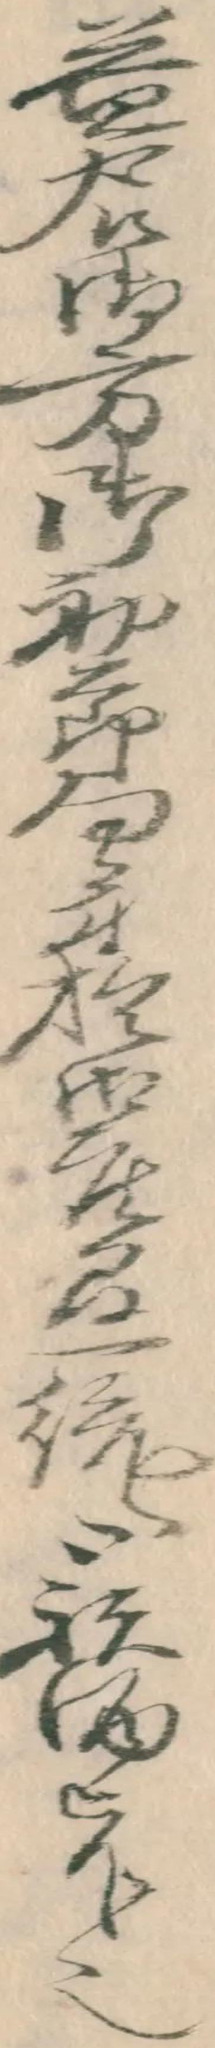益君御方御初節句ニ付於御座間一統御祝酒被下也
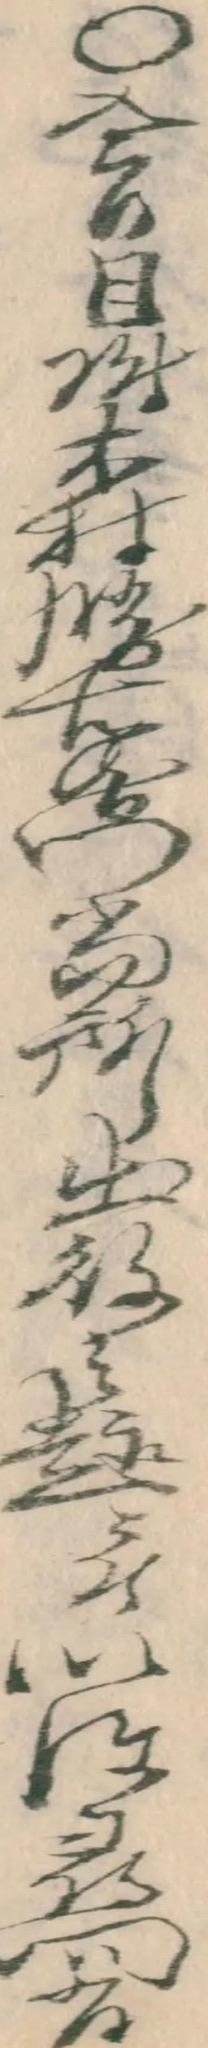○今日目附木村勝右衛門當所出役之趣ニ付以後尋問有
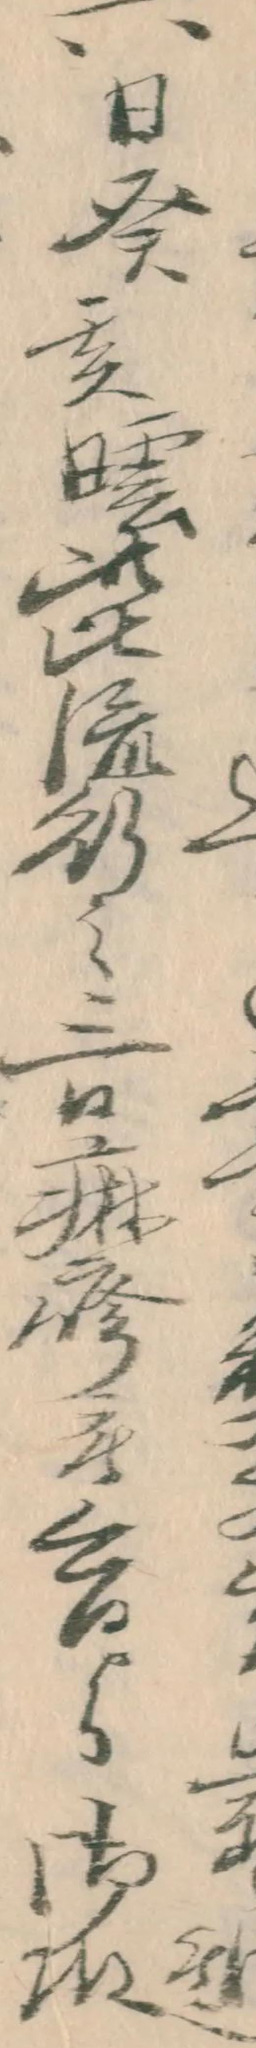六日癸亥曇此比流行之三日麻疹ニ付今日より御殿
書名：賀茂社記録. 第67冊
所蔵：国立国会図書館 National Diet Library, JAPAN
